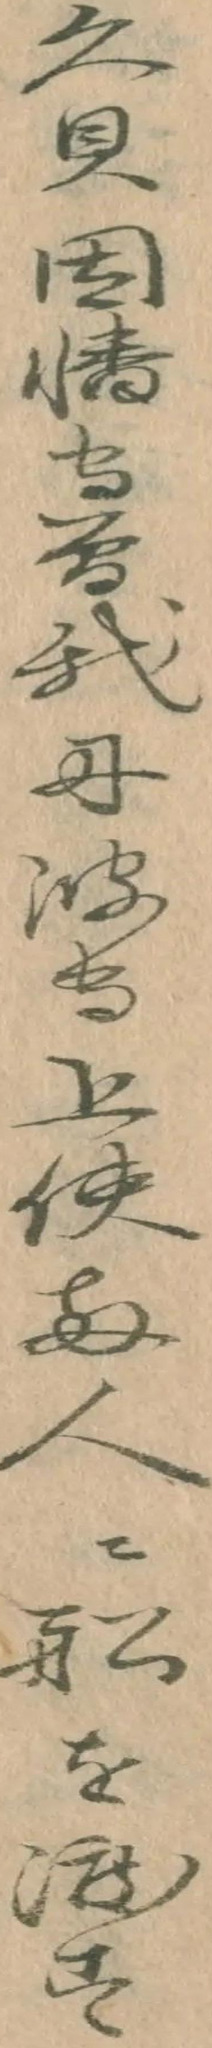久貝因幡守曽我丹波守上使両人に舩を渡春
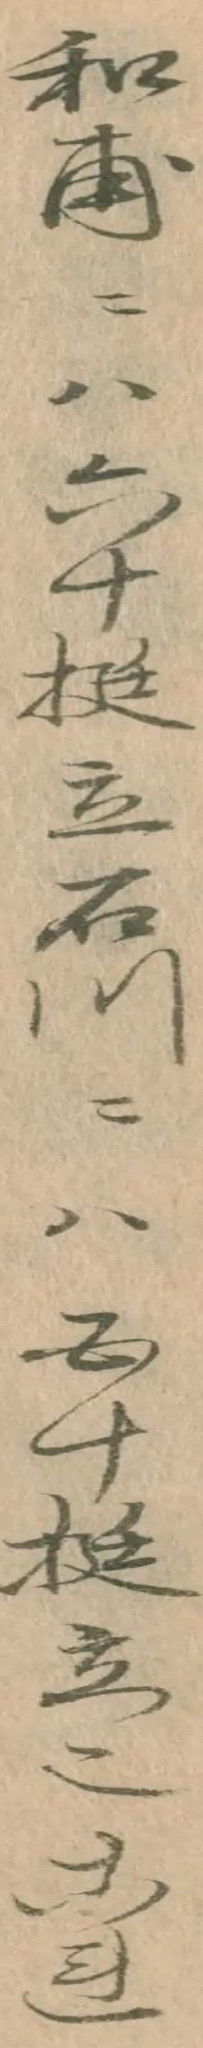和甫には六十挺立石川には五十挺立也古連
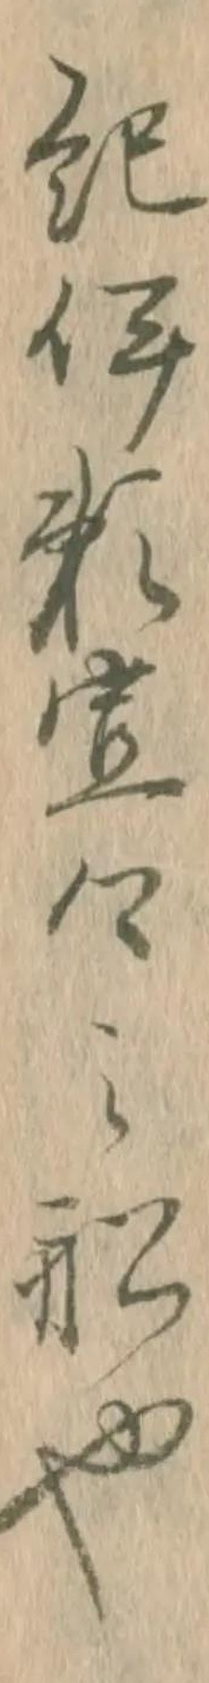紀伊頼宣郷之舩也
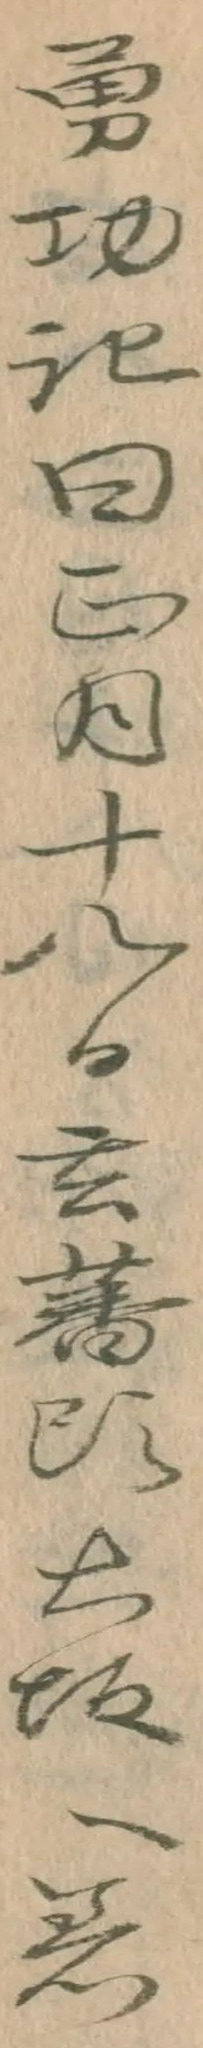勇功記曰正月十八日玄蕃頭大坂へ着
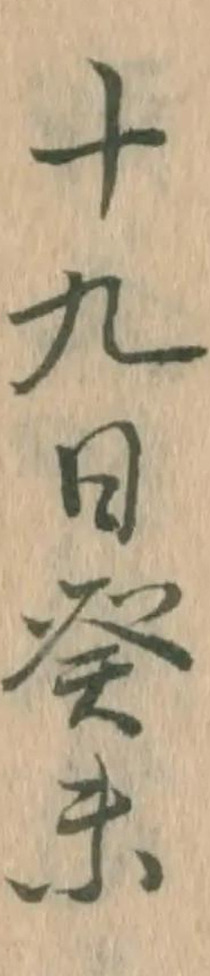十九日癸未
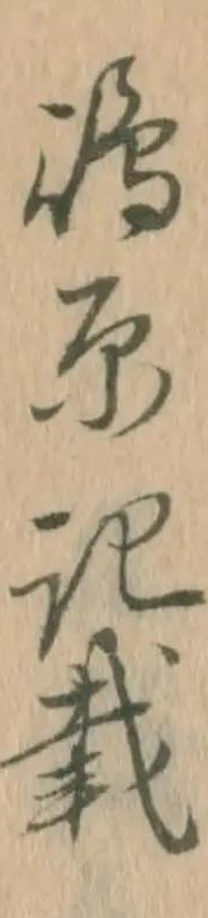島原記載
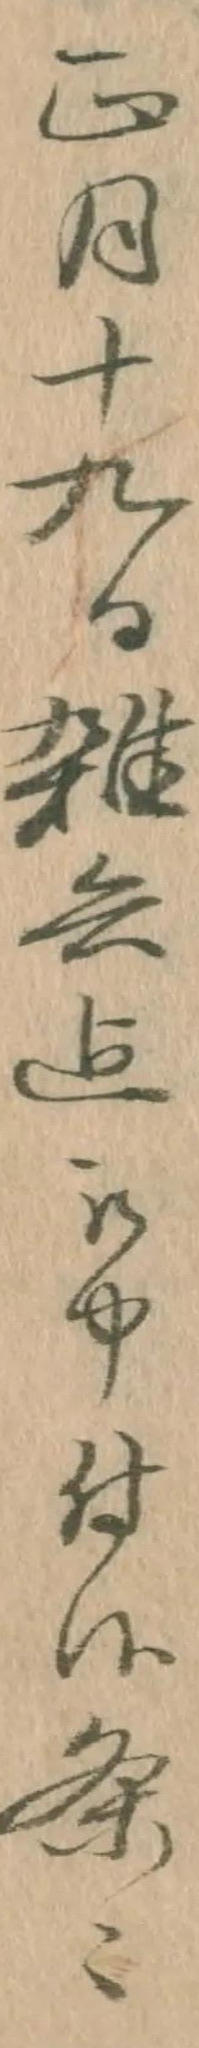正月十九日雑兵迄被申付候条々
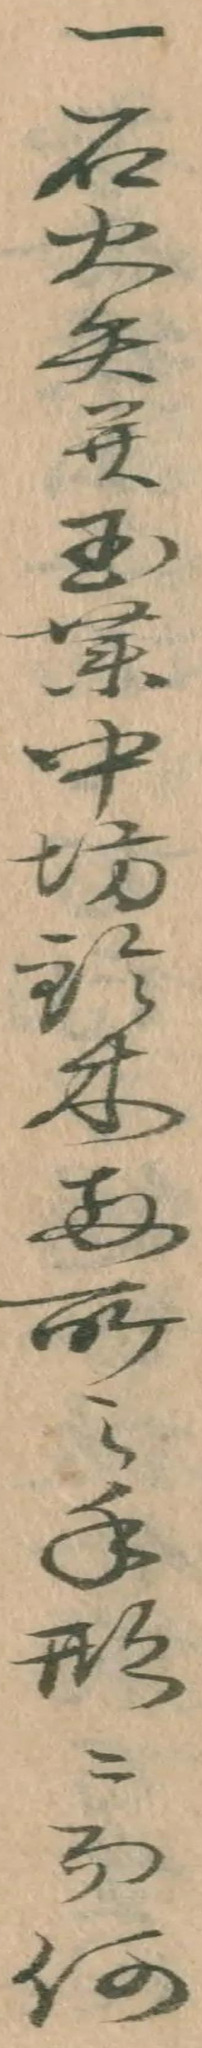一石火矢幷玉薬中坊鈴木両所之手形に而何
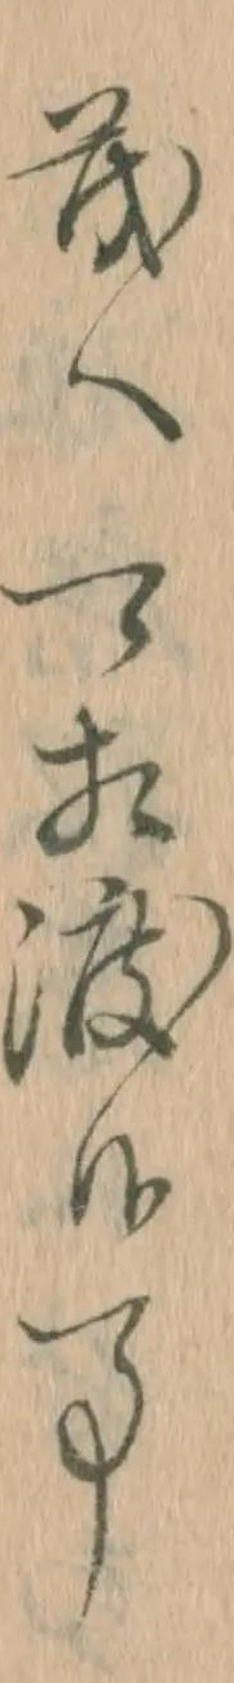茂へか相渡候事
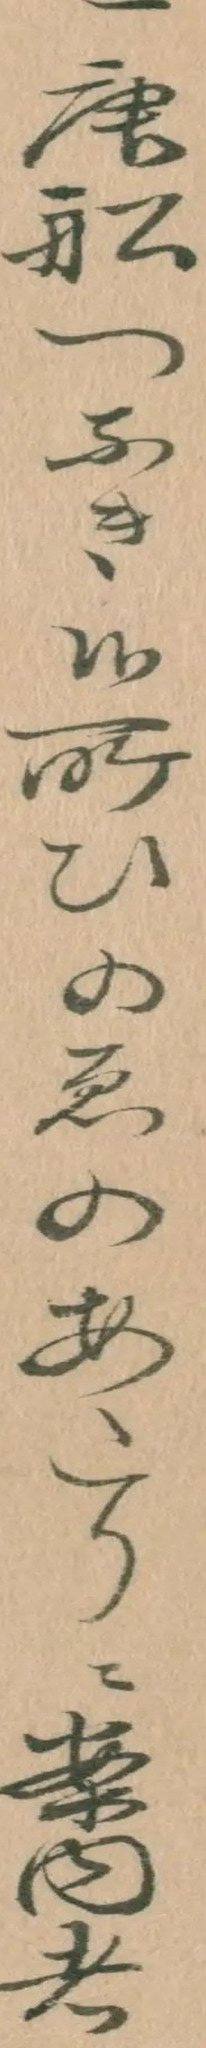一唐船つなき候所ひのゑのあたりに案内者
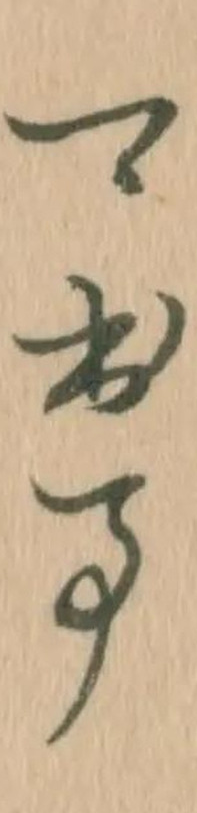可出事
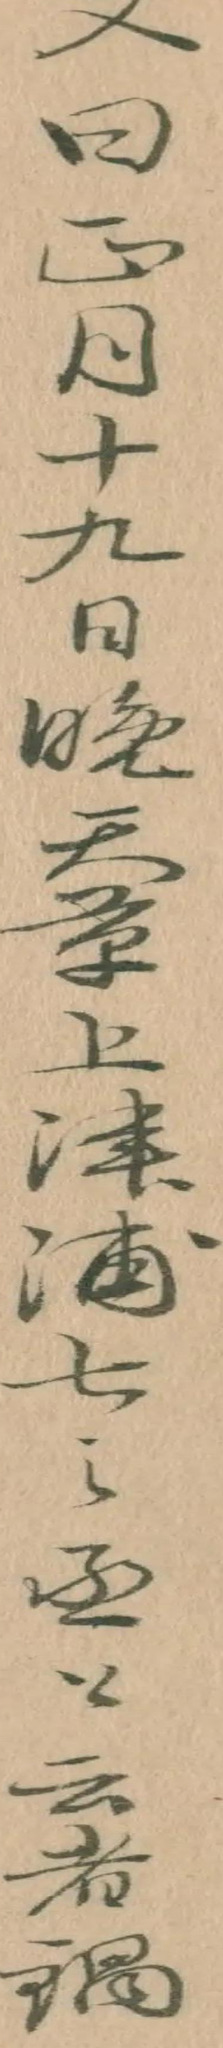又曰正月十九日晩天草上津浦七之丞と云者鍋
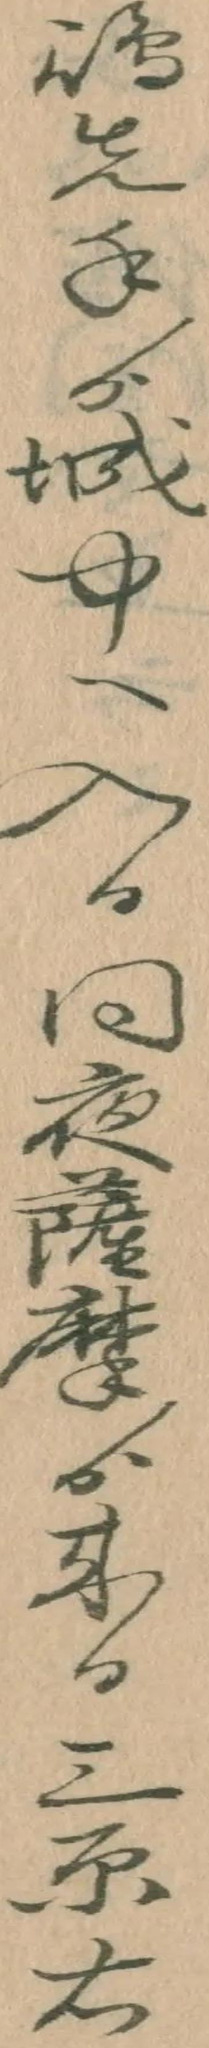島先手ゟ城中へ入る同夜薩摩ゟ来る三原右
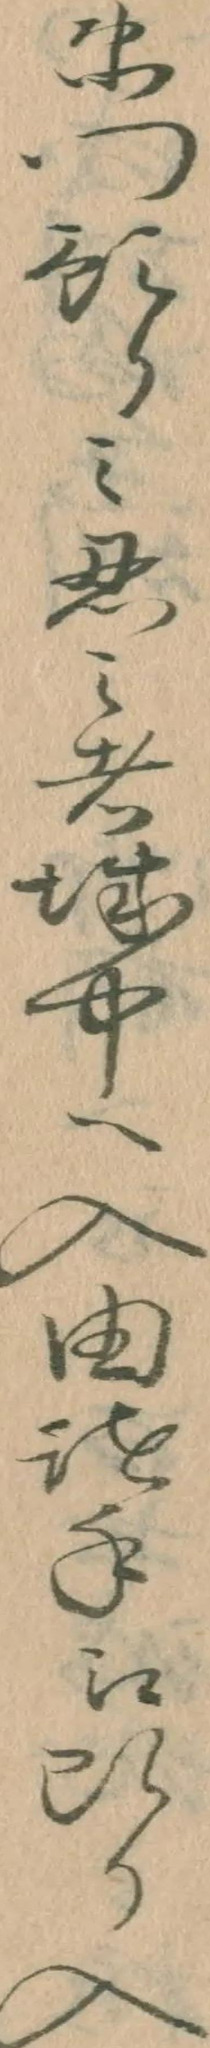衛門預り之忍之者城中へ入由諸手江預り入
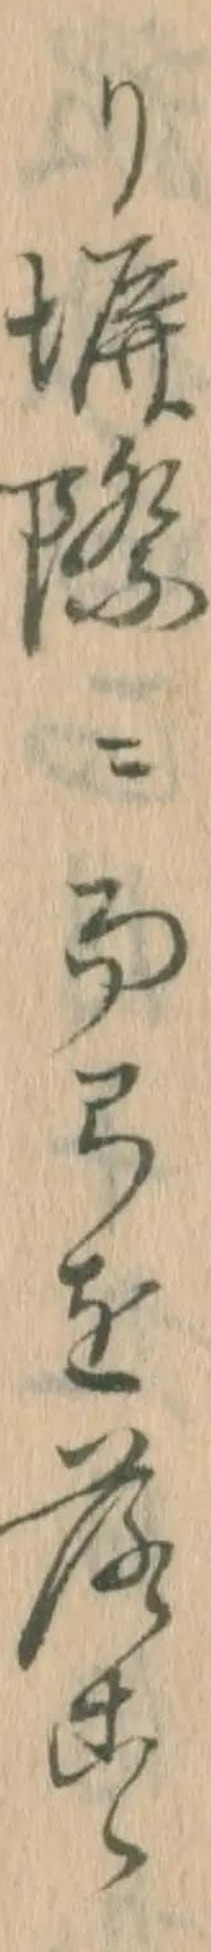り塀際に而弓を落春
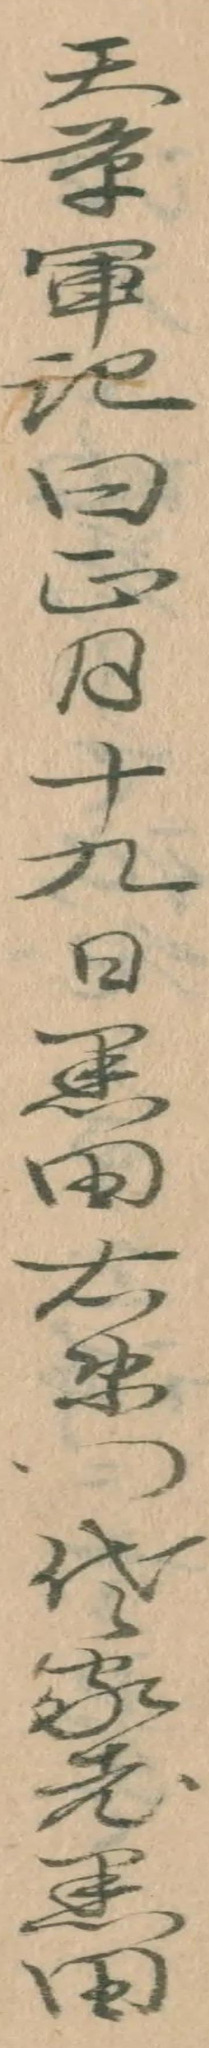天草軍記曰正月十九日黒田右衛門佐家老黒田
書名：切支丹御退治記 49巻. [6]
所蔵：国立国会図書館 National Diet Library, JAPAN
